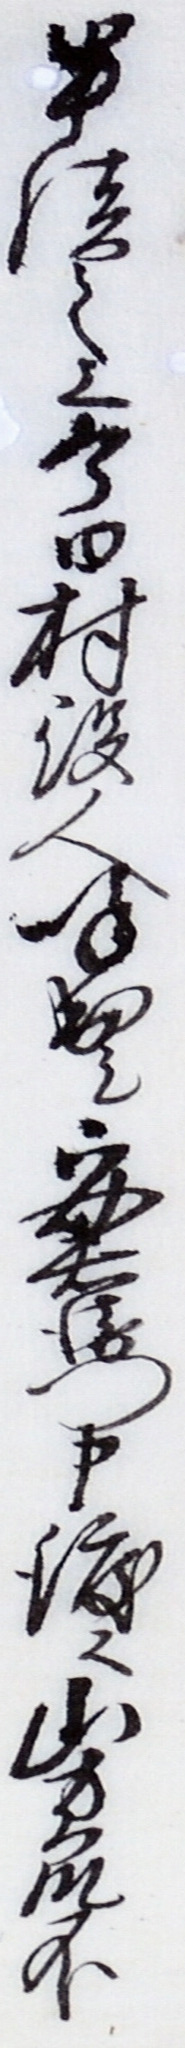申談之上今日村役人呼出シ安右衛門申渡ス山方衆不
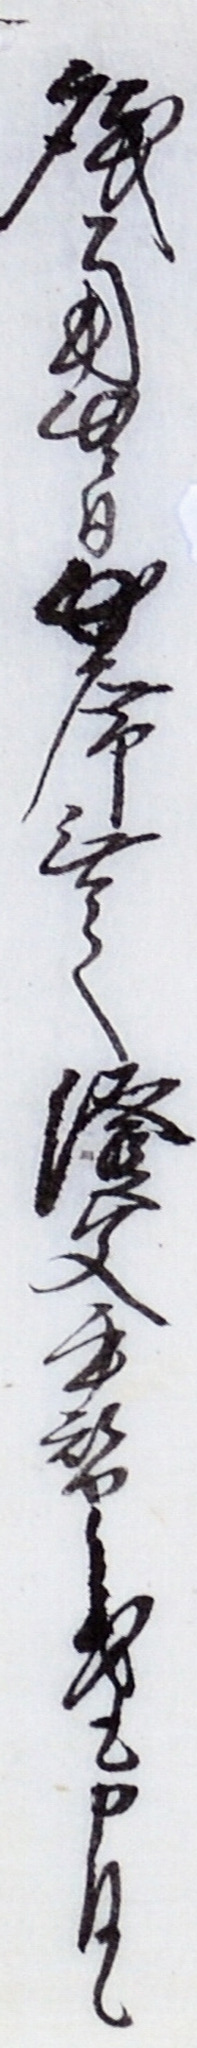残御用出ニ付出席無之證文書替之義も申付候
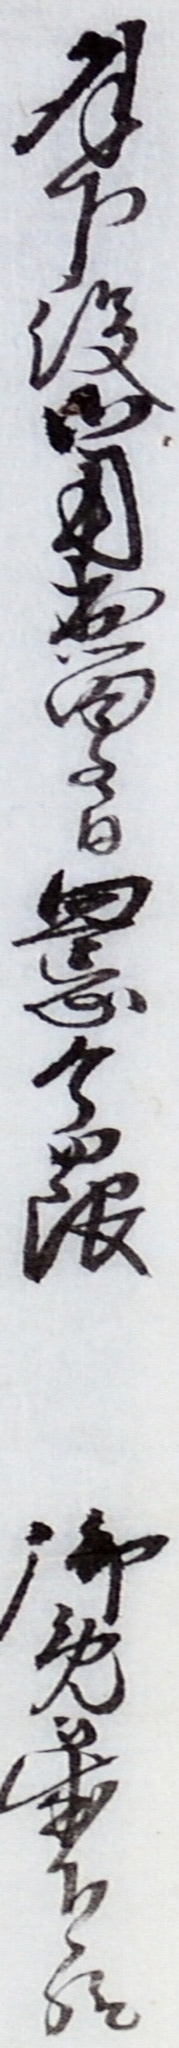外下役御用出留子ニ付廻今日限御免被成下候様
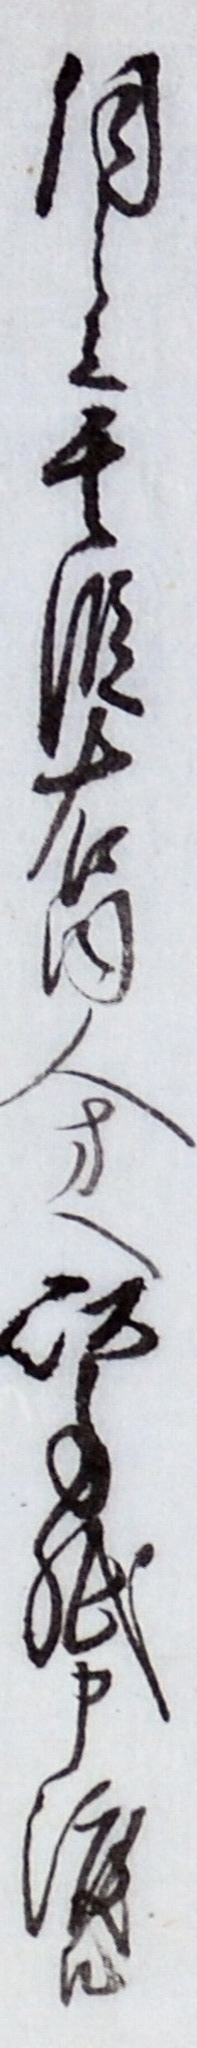伺之上其段右同人方へ以手紙申渡候
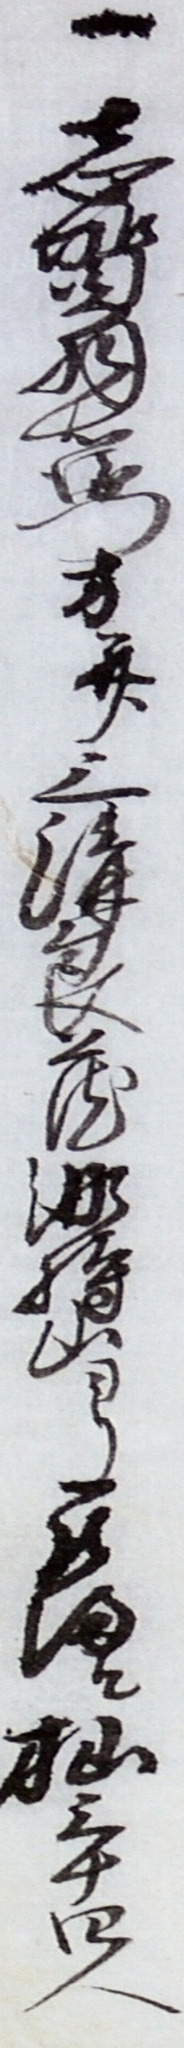一志賀羽右衛門方并三溝良蔵非持山ヨリ罷帰ル杣三十四人
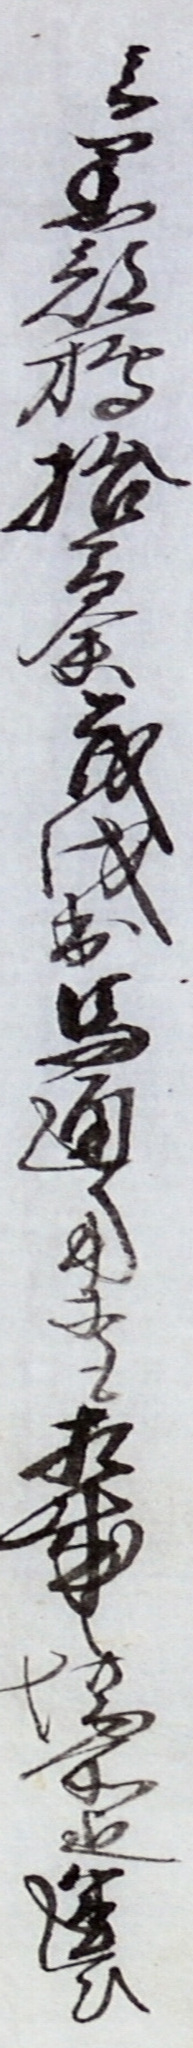ニ而黒部榑拾間余も伐出馬通用等も相成候場所迄運ひ
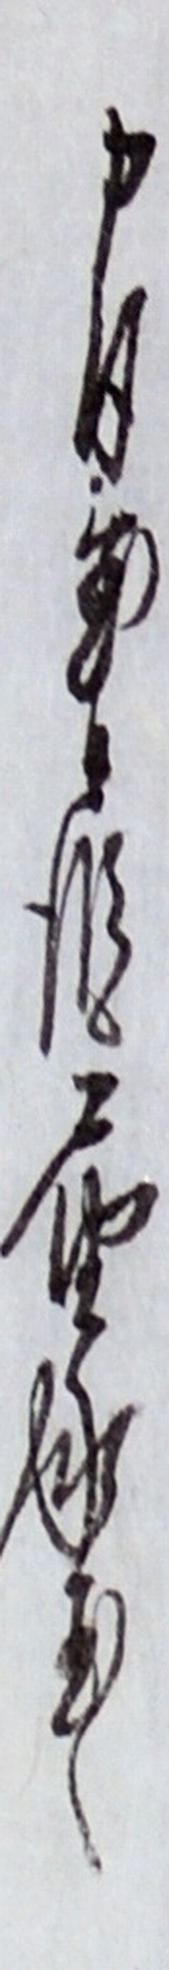申付置候段届承置候
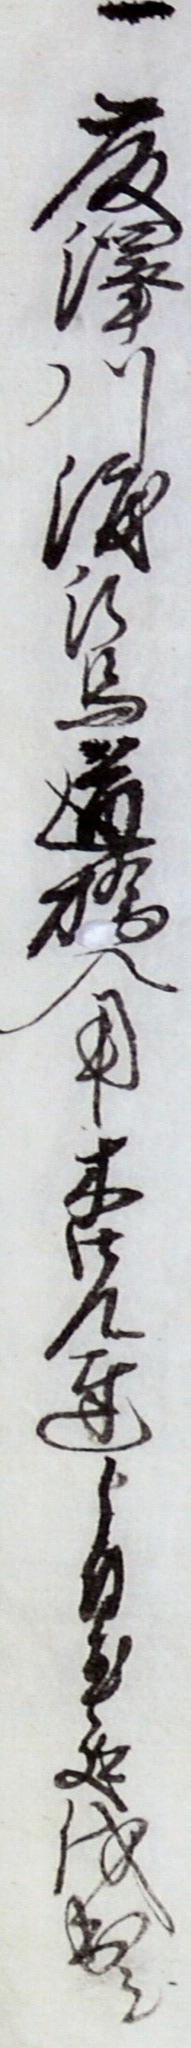一藤澤川渡行馬道橋入用木先達申付置候処伐出シ

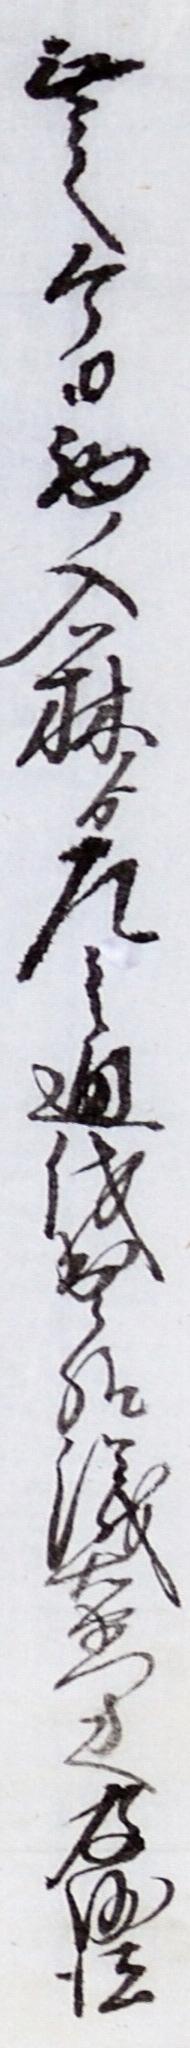無之今日西ノ入御林ゟ左之通伐出候様儀右衛門方へ及沙汰
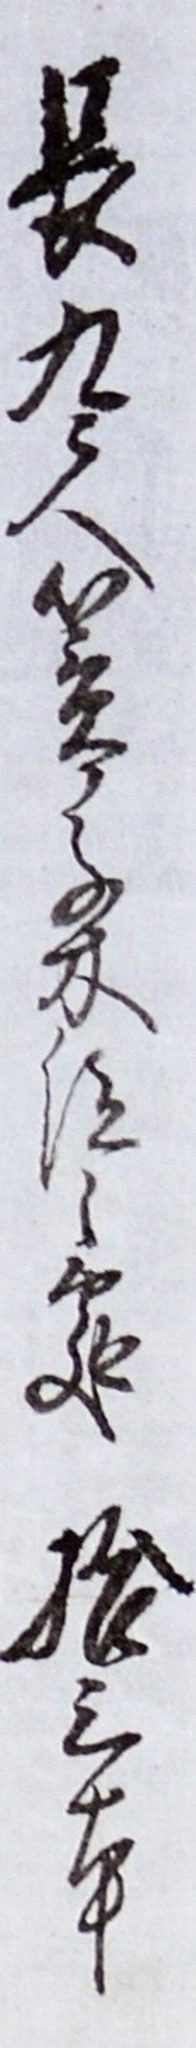長九尺簀ノ子木程之処拾三本
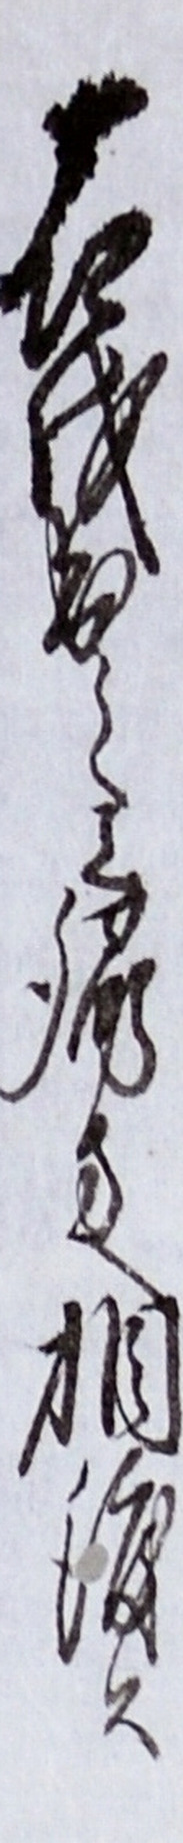右伐出之上郷方へ相渡候
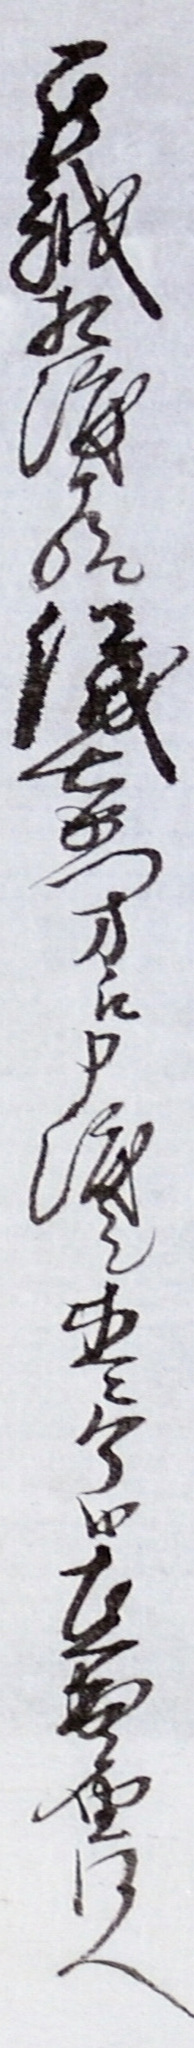罷越相渡候様儀右衛門方江申渡シ直ニ今日在出届同人
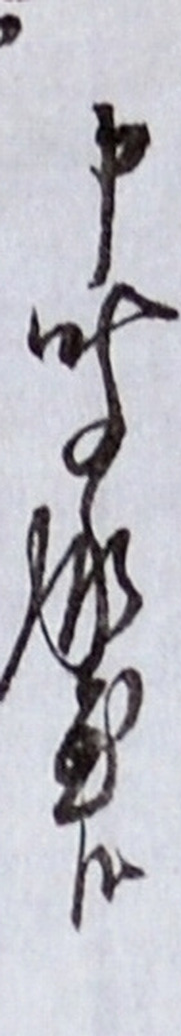申聞承置候
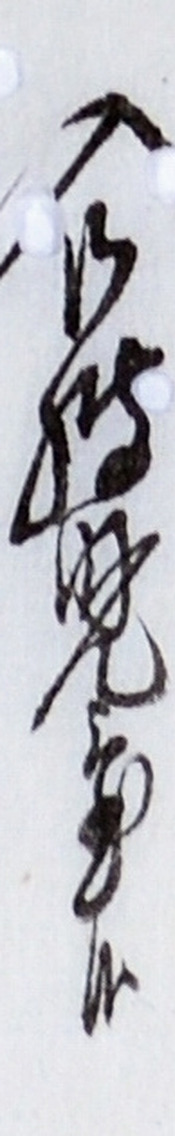入御披覧置候
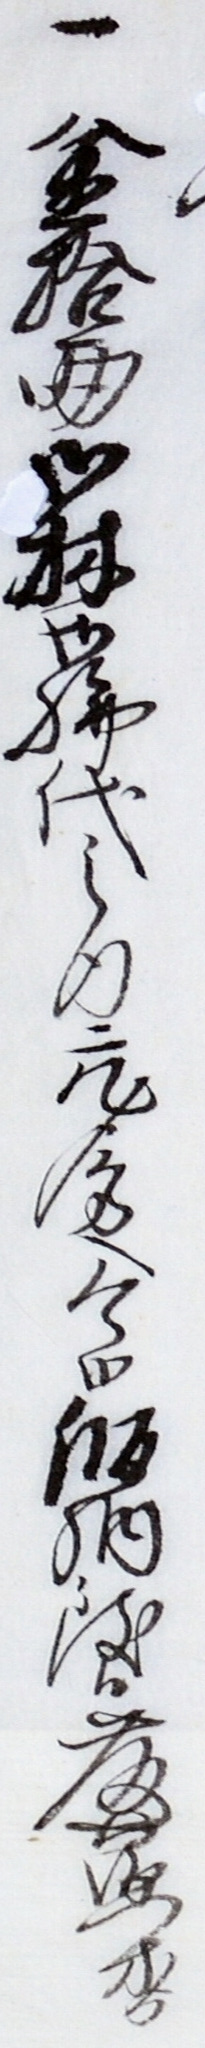一金拾両御林御払代之内元〆方へ今日仮納致候藤左衛門方ゟ
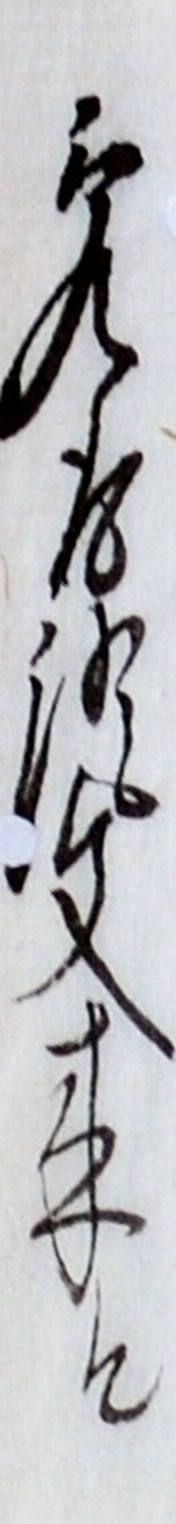受取證文来ル
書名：御山奉行御用控
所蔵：伊那市立高遠町図書館・合同会社AMANE
